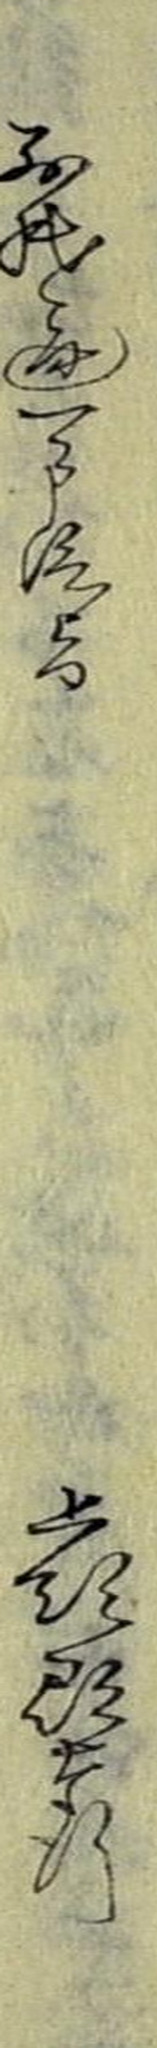別紙之通可申渡旨上領郡奉行
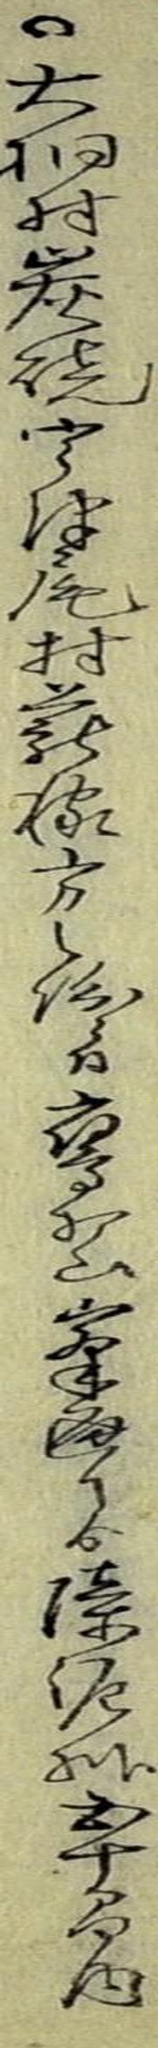○大桐村炭焼宇津尾村薪稼方之儀ニ付鷹打山峰通りゟ漆泥掛五十間内
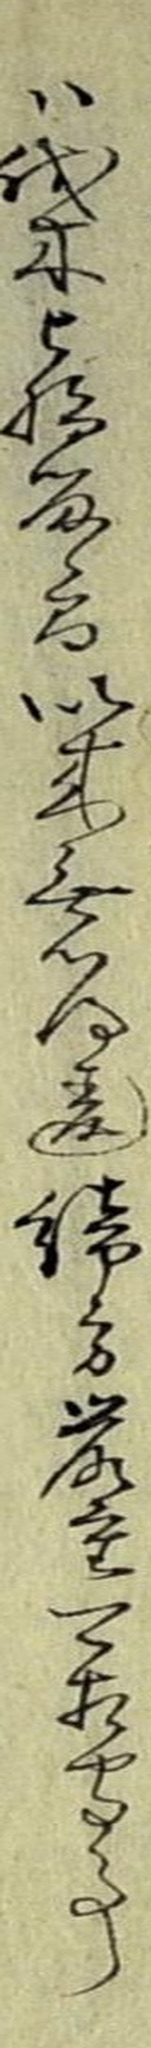ハ伐木被指留候間以来無心得違締方厳重可相守事
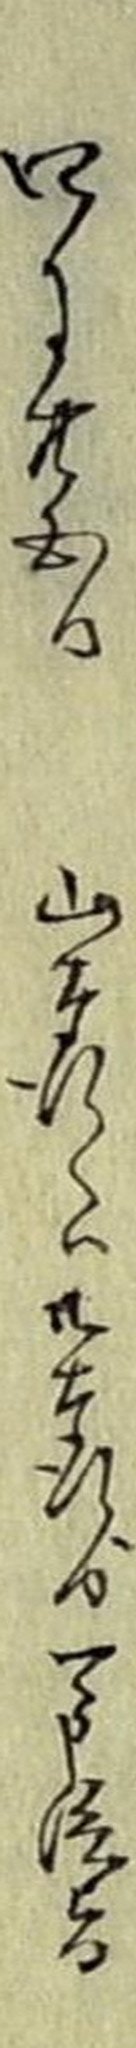四月廿五日山奉行へハ御奉行ゟ可申渡旨
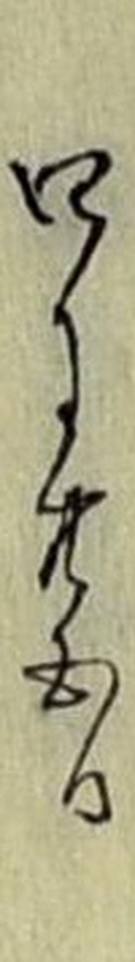四月十一日
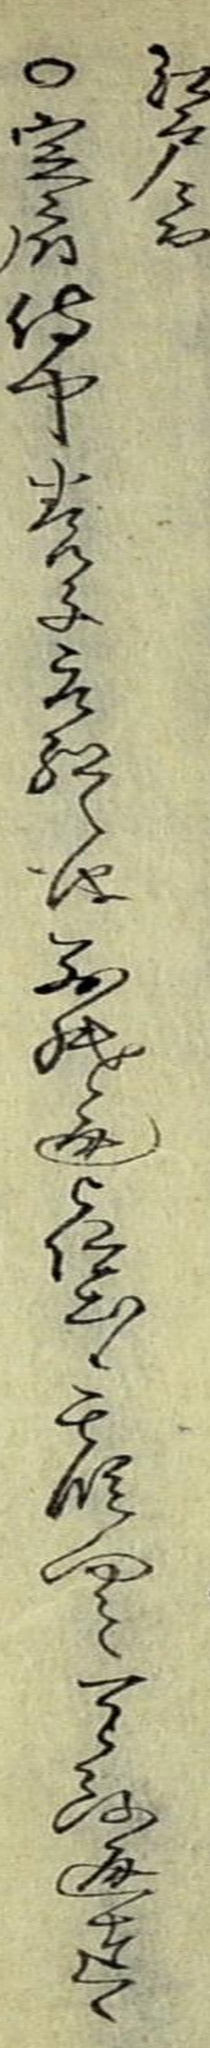○定府侍中養子取組之儀別紙之通被仰出候其段向々へ可被致通達候
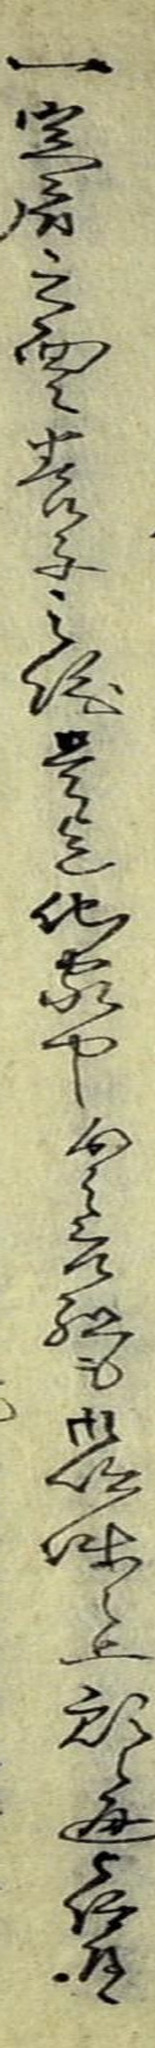一定府之面々養子之儀是迄他家中ゟ之取組も御吟味之上願之通被仰付候
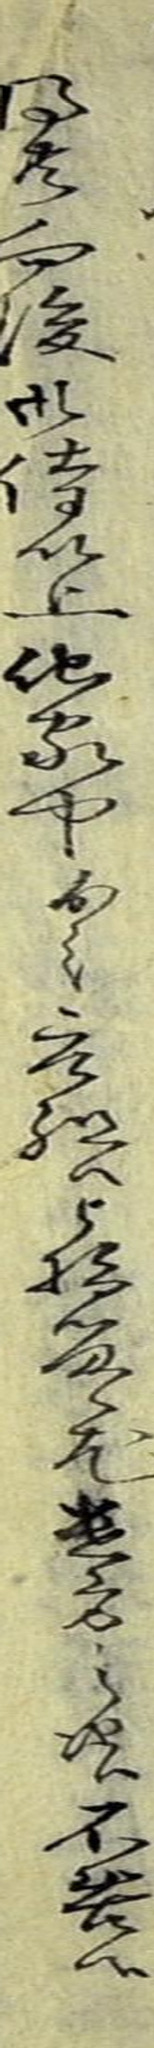得共向後御侍以上他家中ゟ之取組ハ被指留候尤遣方之儀ハ不苦候
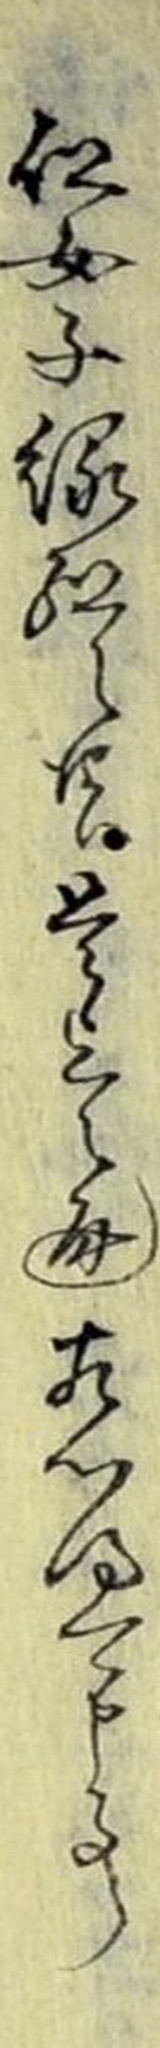但女子縁組之儀ハ是迄之通相心得可申事

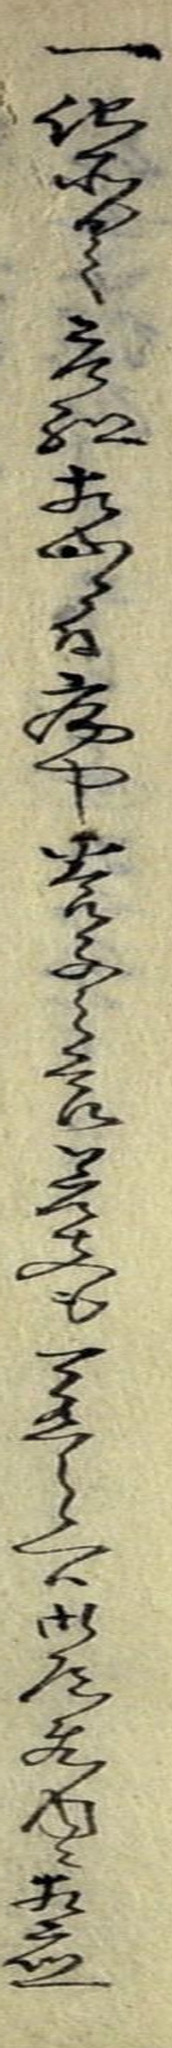一他所ゟ之取組相止候ニ付病中養子之節差支も可有之候へハ御屋敷内ニ相応
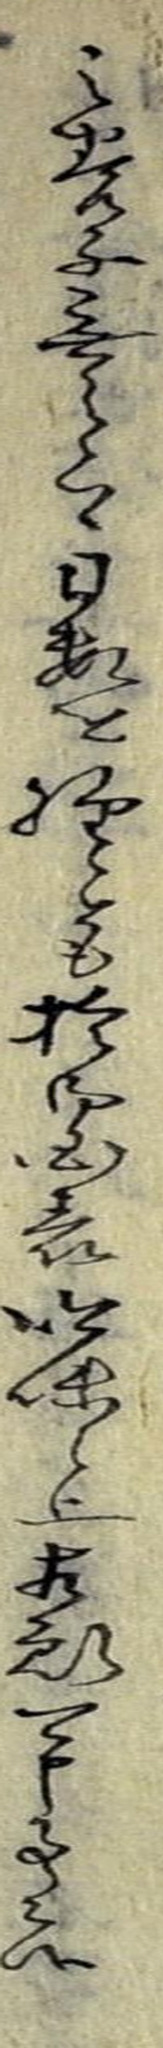之養子無之候ハヽ日数を経候とも於御国表吟味之上相願可申事ニ候
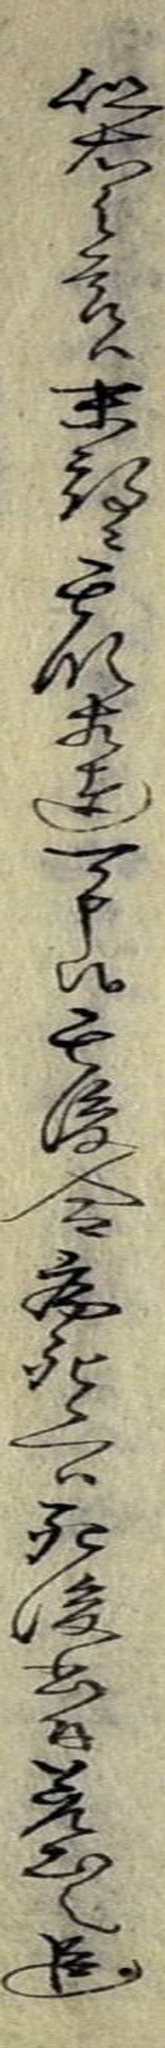但右之節ハ末期ニ其段相達可申候其後令病死候へハ死後書付差出之追
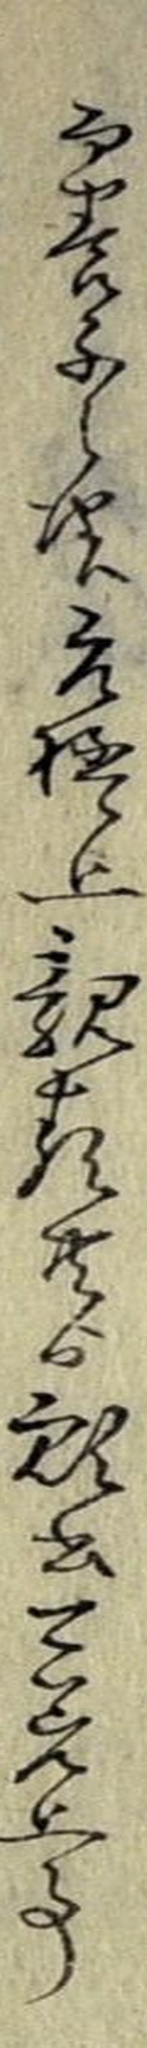而養子之儀ハ取極候上親類共ゟ願書可差上事
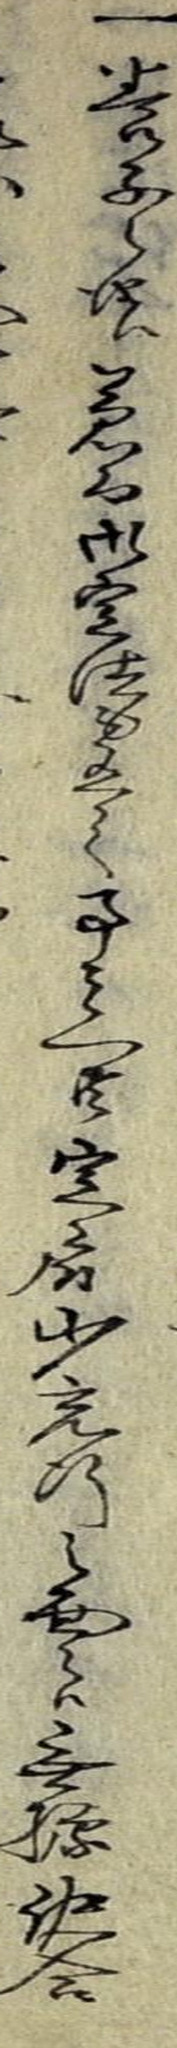一養子之儀兼而御定法も有之事ニ候へ共定府少充行之面々ハ無拠訳合
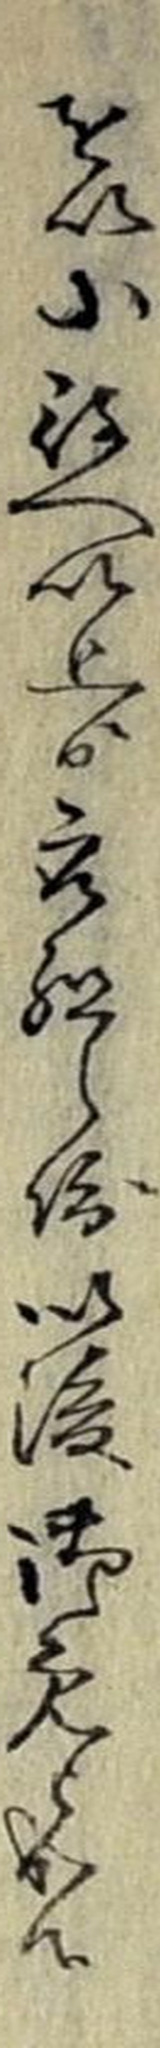を以小役人以上ゟ取組之儀以後御免被成候
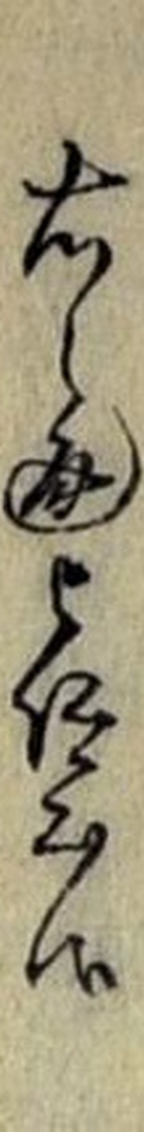右之通被仰出候
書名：命令之部 五
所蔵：福井県文書館 Fukui Prefectural Archives
